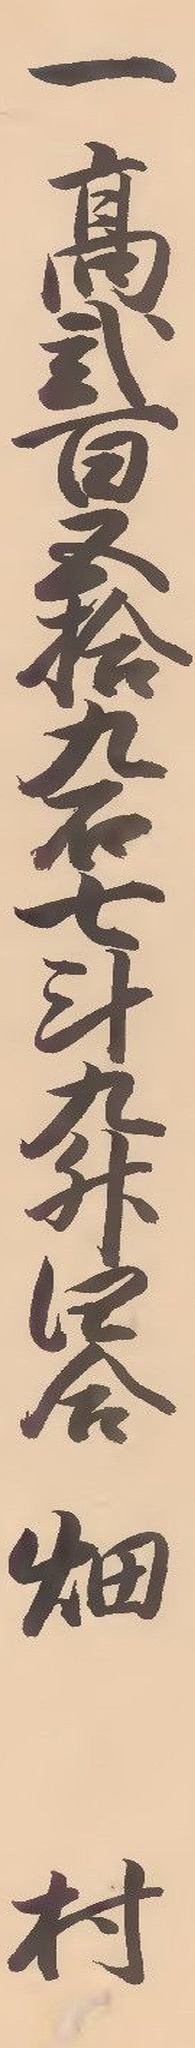一髙弐百五拾九石七斗九升四合畑村
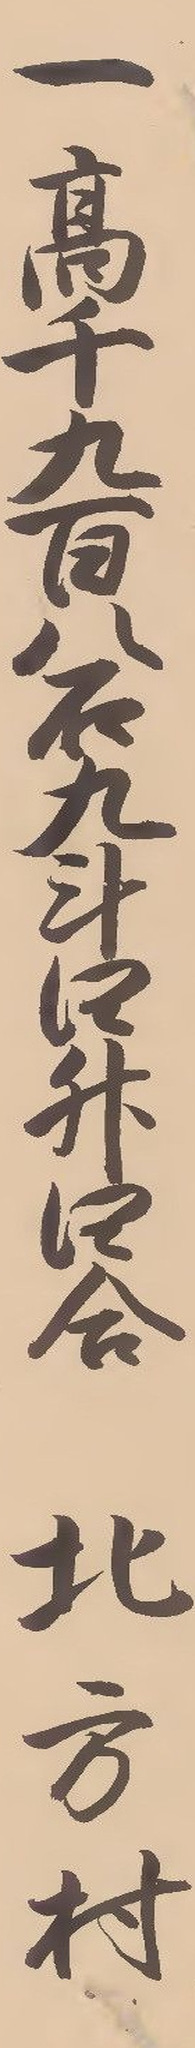一髙千九百八石九斗四升四合北方村
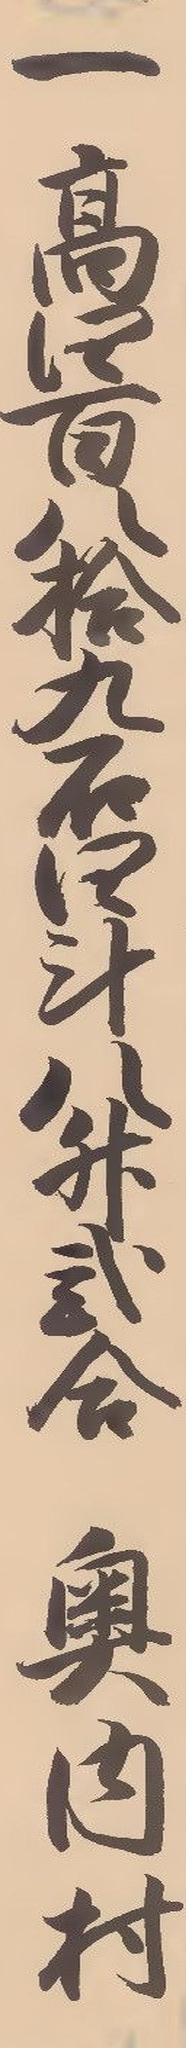一髙四百八拾九石四斗八升弐合奥内村
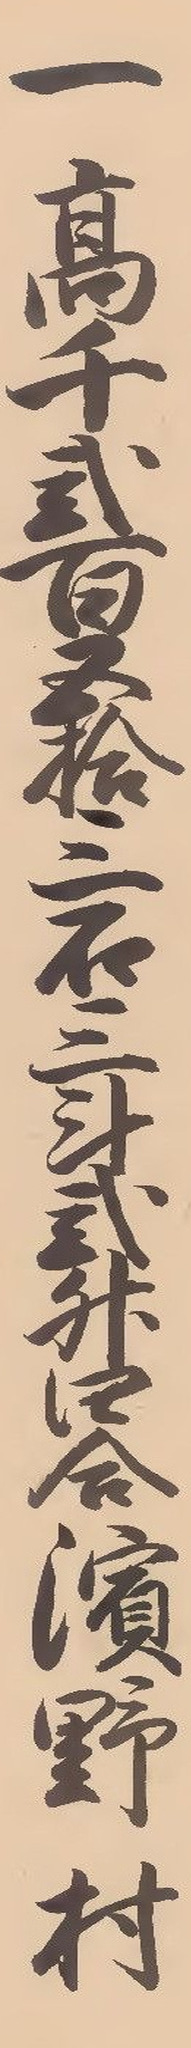一髙千弐百五拾三石三斗弐升四合濱野村
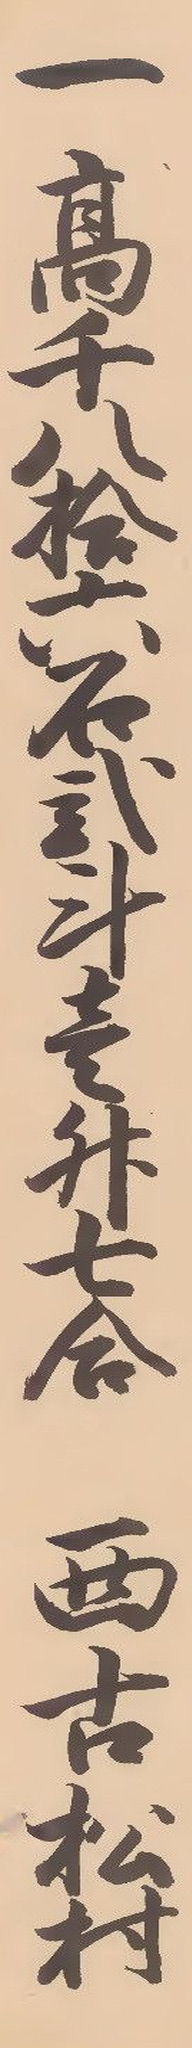一髙千八拾六石弐斗壱升七合西古松村

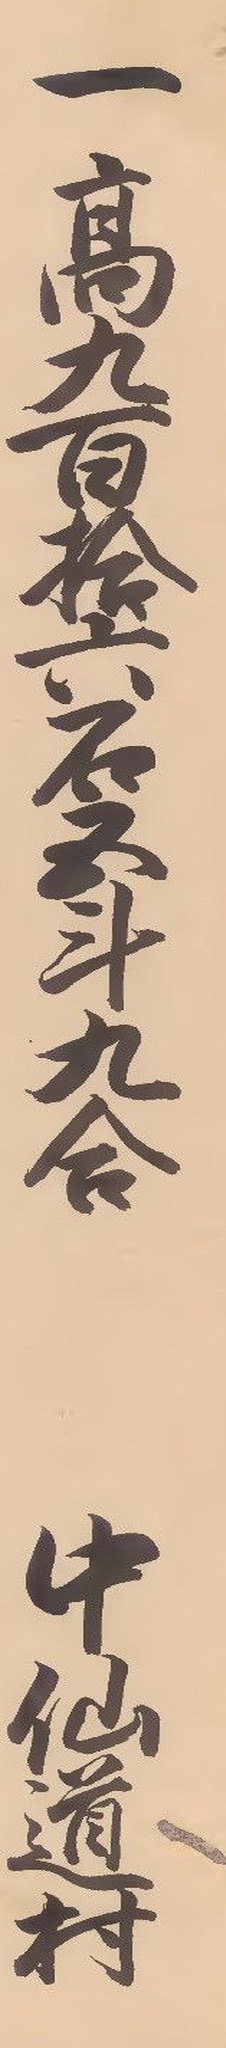一髙九百拾六石五斗九合中仙道村
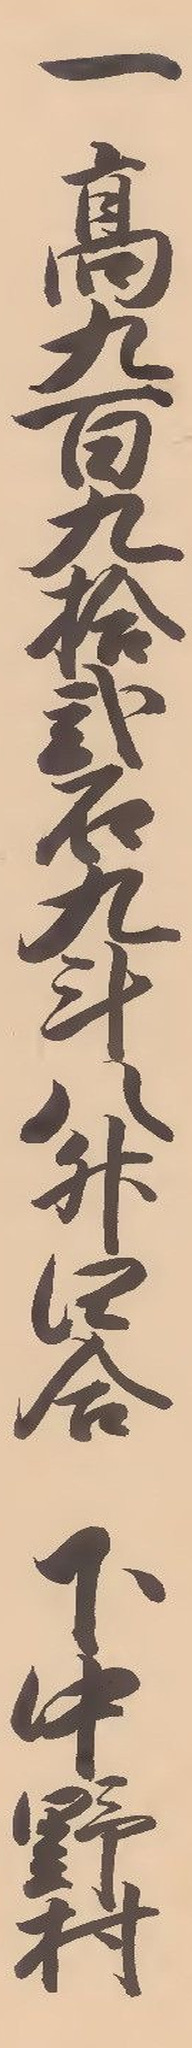一髙九百九拾弐石九斗八升四合下中野村
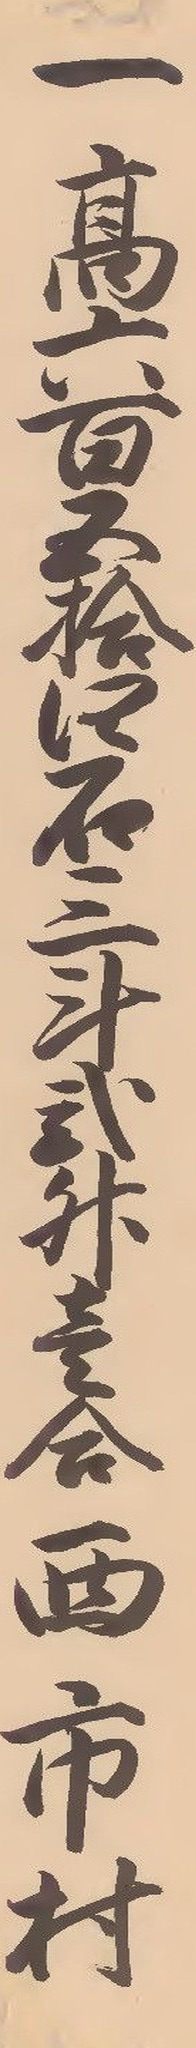一髙六百五拾四石三斗弐升壱合西市村
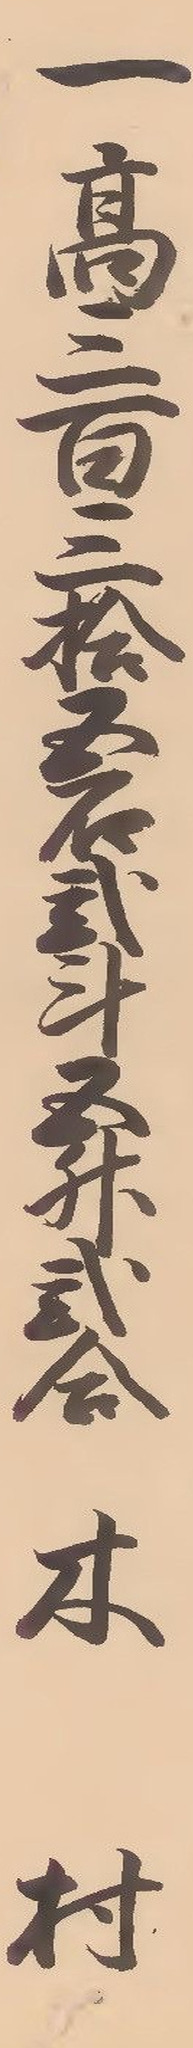一髙三百三拾五石弐斗五升弐合木村
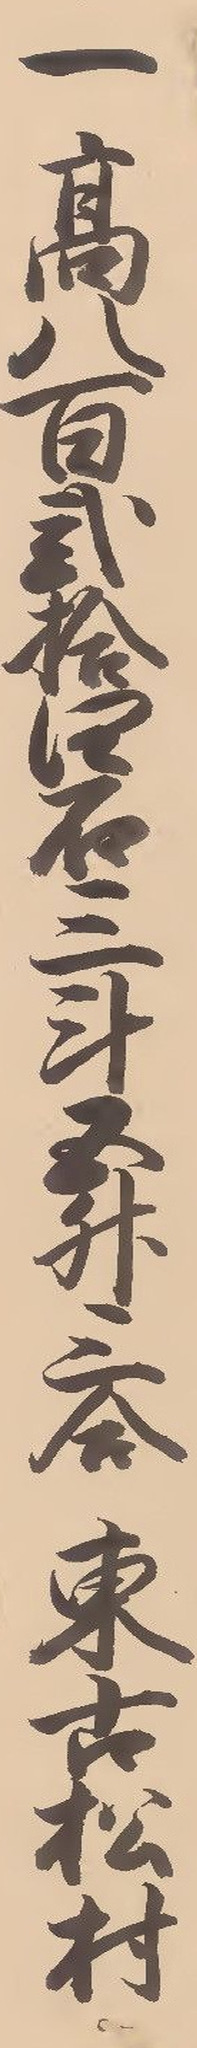一髙八百弐拾四石三斗五升三合東古松村
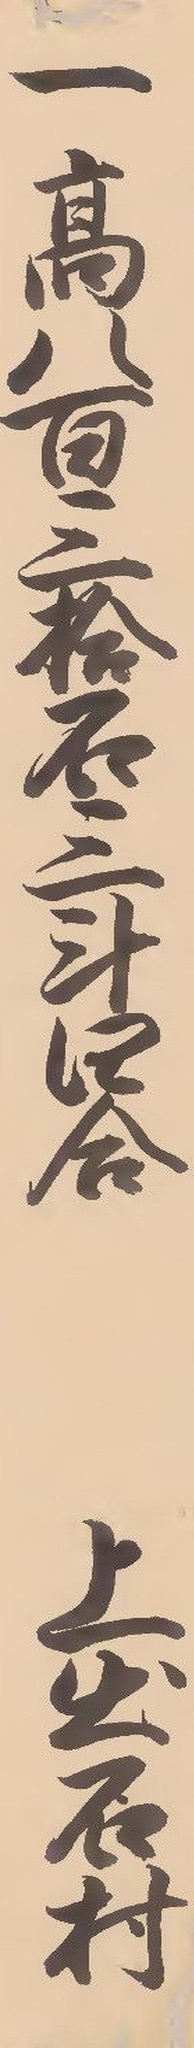一髙八百三拾石三斗四合上出石村
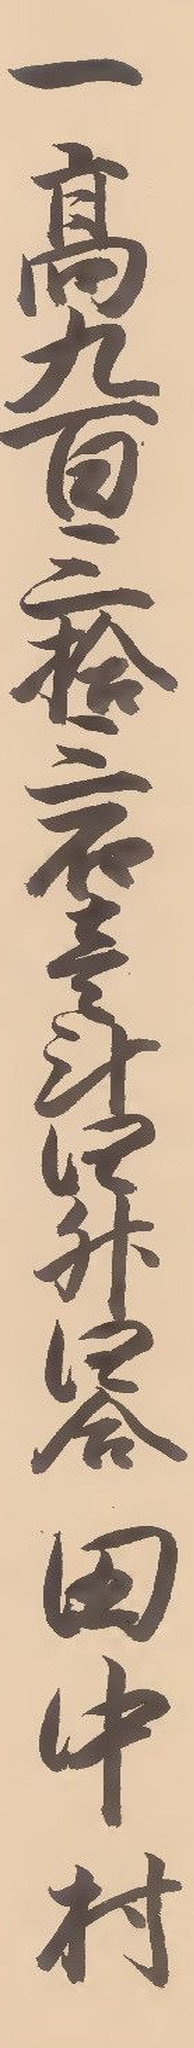一髙九百三拾三石壱斗四升四合田中村
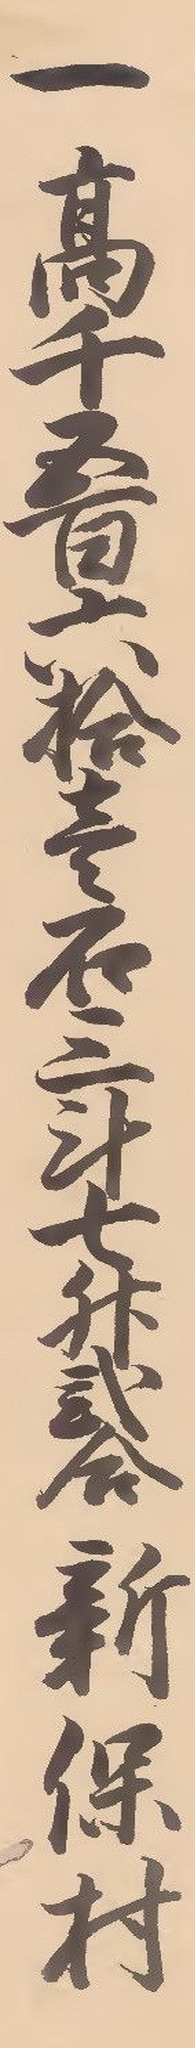一髙千五百六拾壱石三斗七升弐合新保村

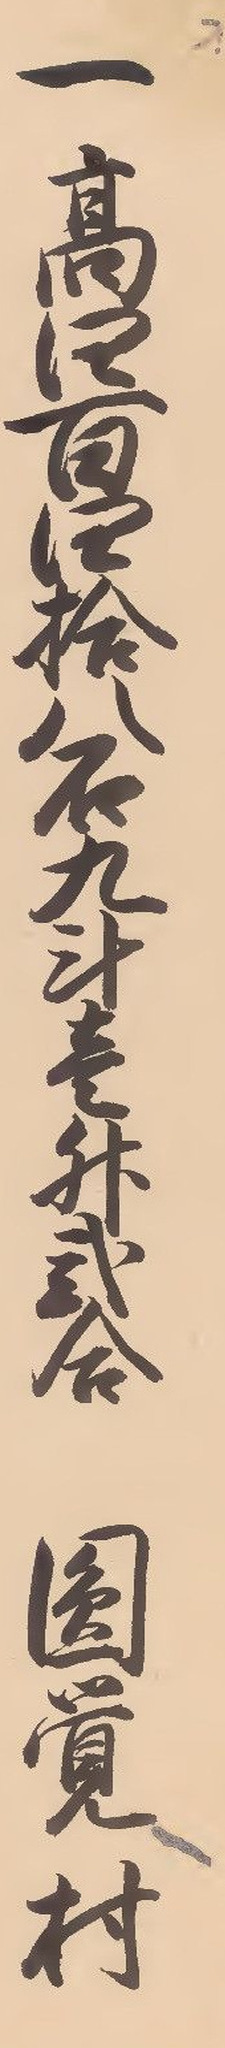一髙四百四拾八石九斗壱升弐合圓覚村
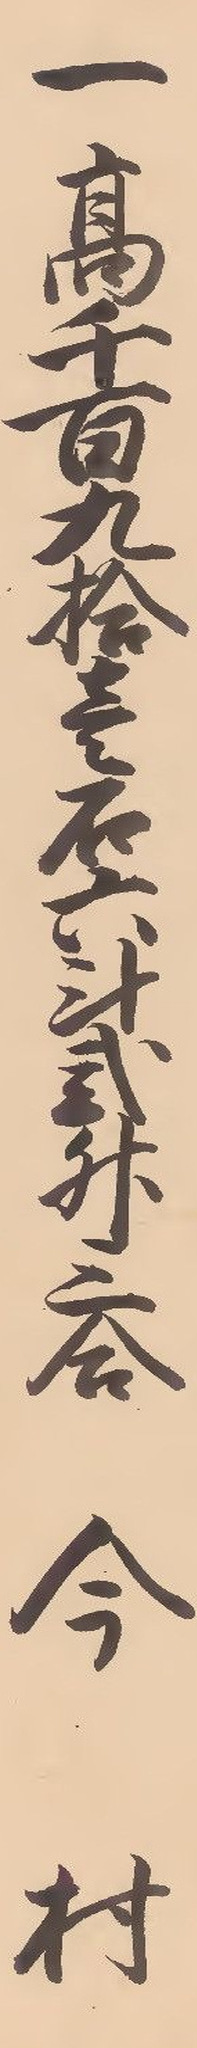一髙千百九拾壱石六斗弐升三合今村
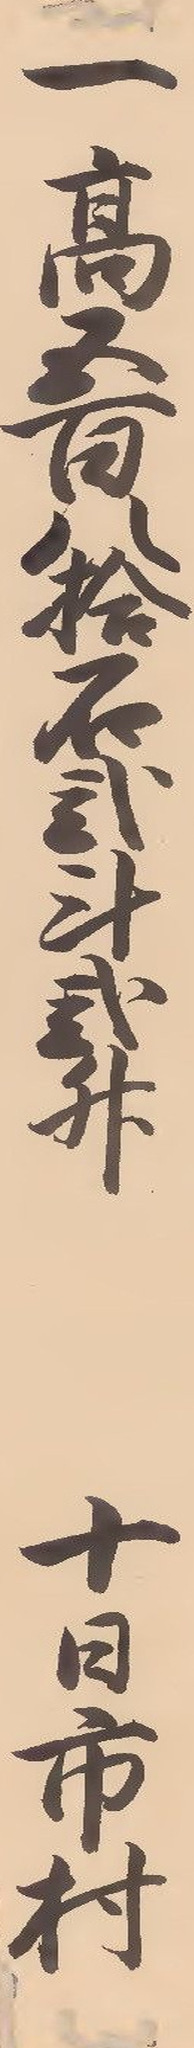一髙五百八拾石壱斗弐升十日市村
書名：備前国郷帳
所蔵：国立公文書館 National Archives of Japan
